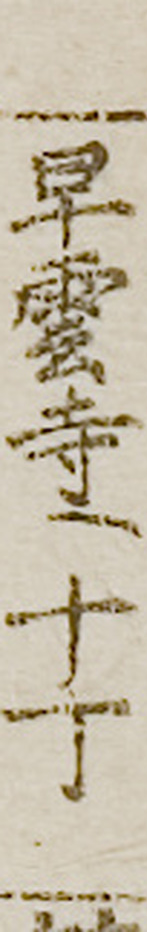早雲寺へ十丁
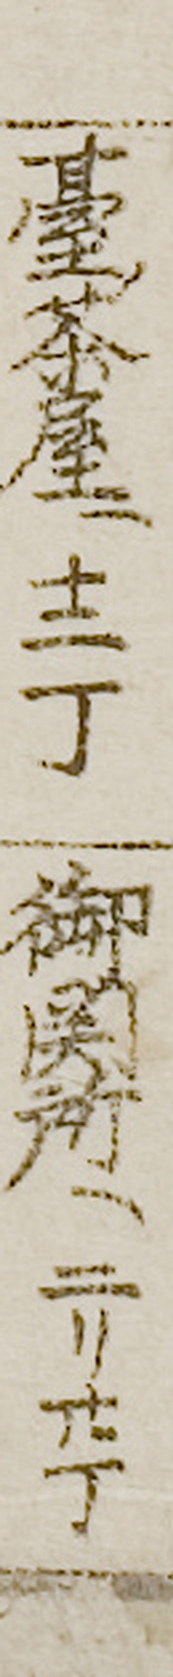台ノ茶屋へ十二丁
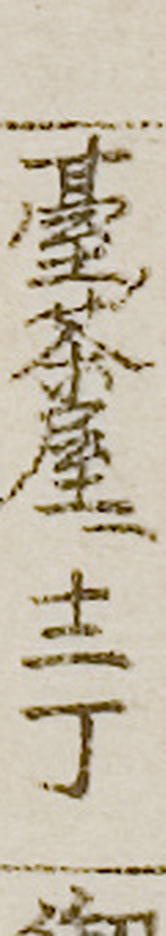台ノ茶屋へ十二丁
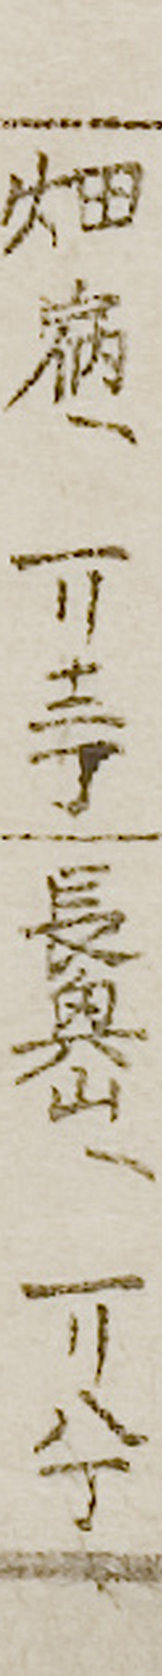畑宿へ一り十二丁
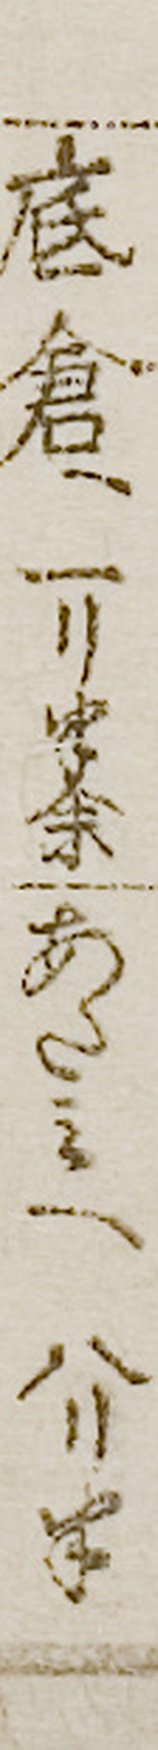底倉へ一リ半余
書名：箱根七温泉図
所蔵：東京大学総合図書館 General Library in the University of Tokyo, JAPAN
